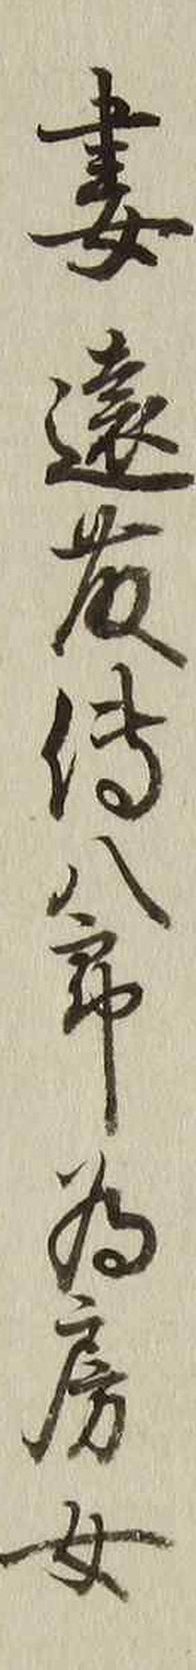妻遠藤伝八郎為房女
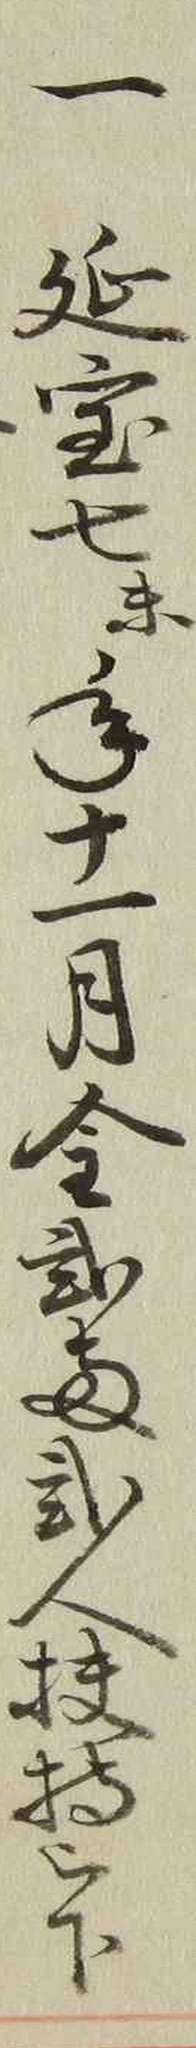一延宝七未年十一月金弐両弐人扶持被下
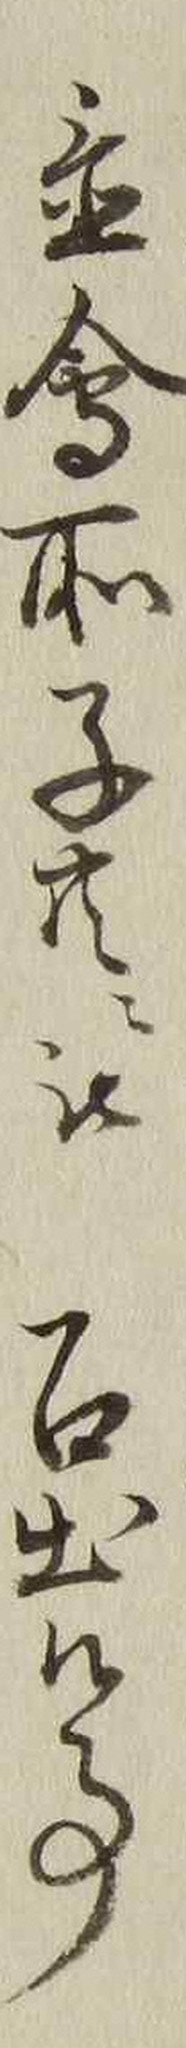置会所子共ニ被召出候事
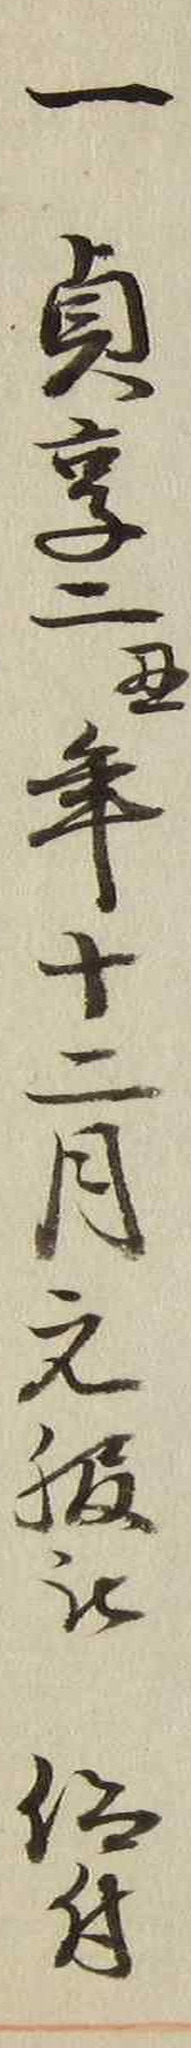一貞享二丑年十二月元服被仰付
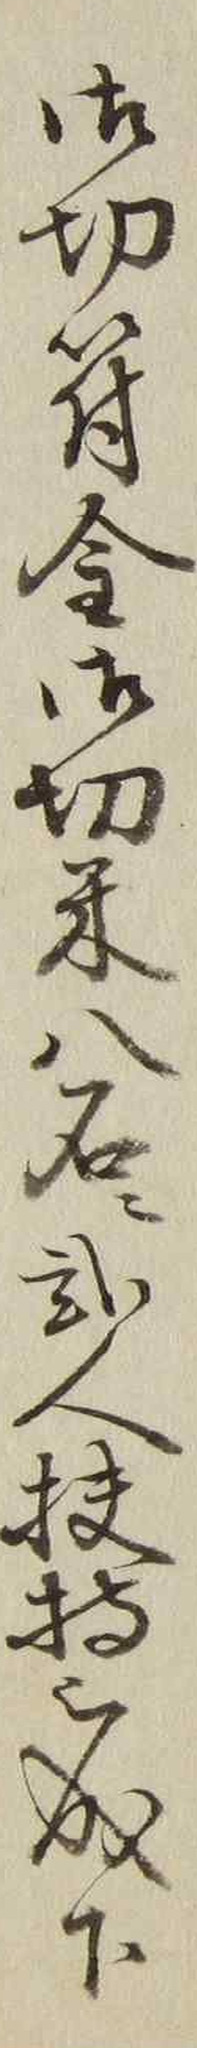御切符金御切米八石ニ弐人扶持被成下
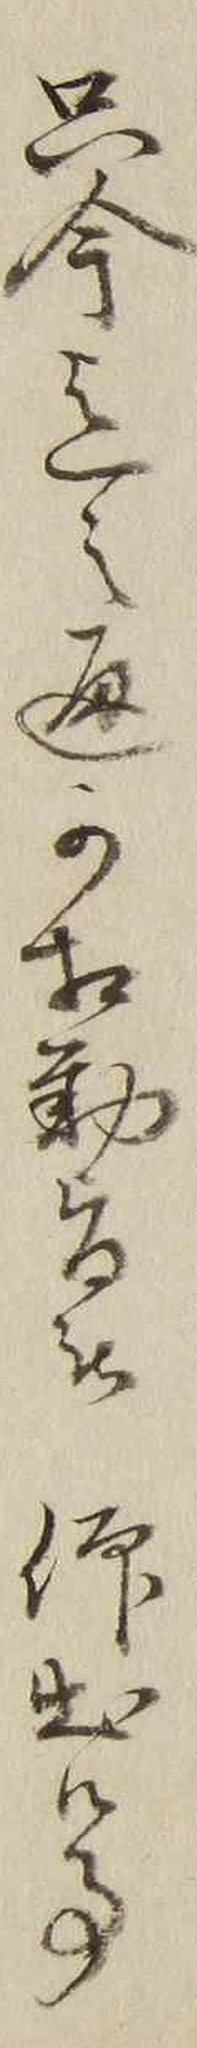只今迄之通可相勤旨被仰出候事

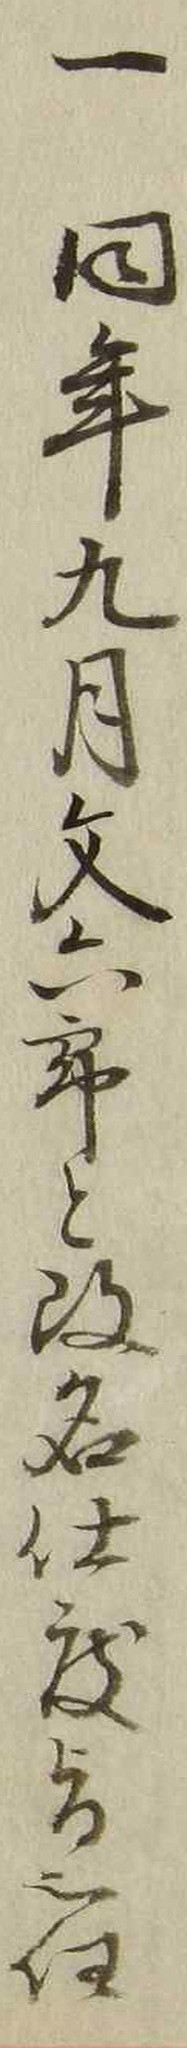一同年九月文六郎と改名仕度旨被任
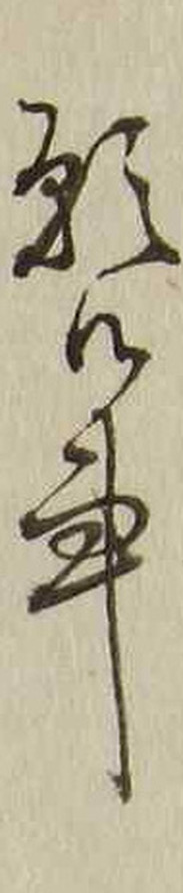願候事
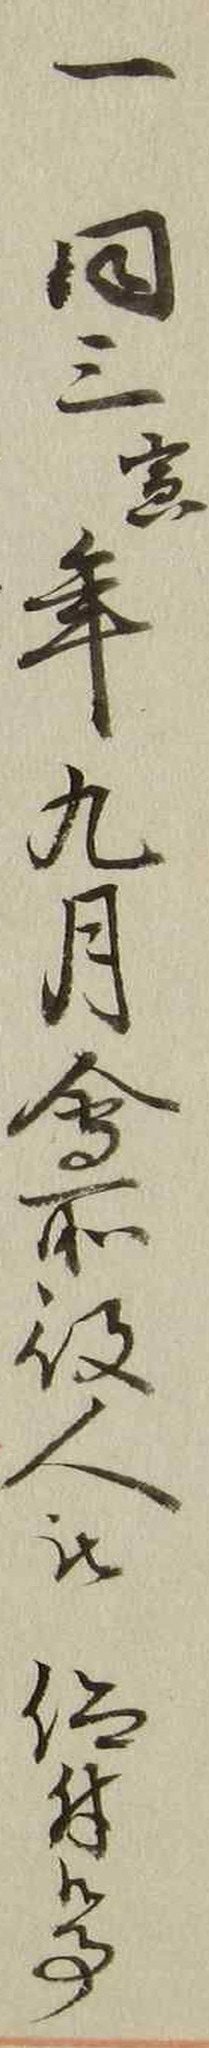一同三寅年九月会所役人被仰付候事
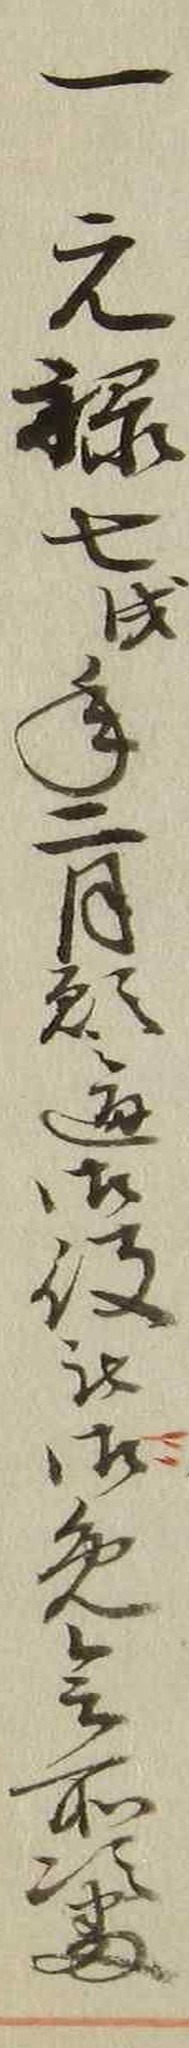一元禄七戊年二月願之通御役被御免会所次番
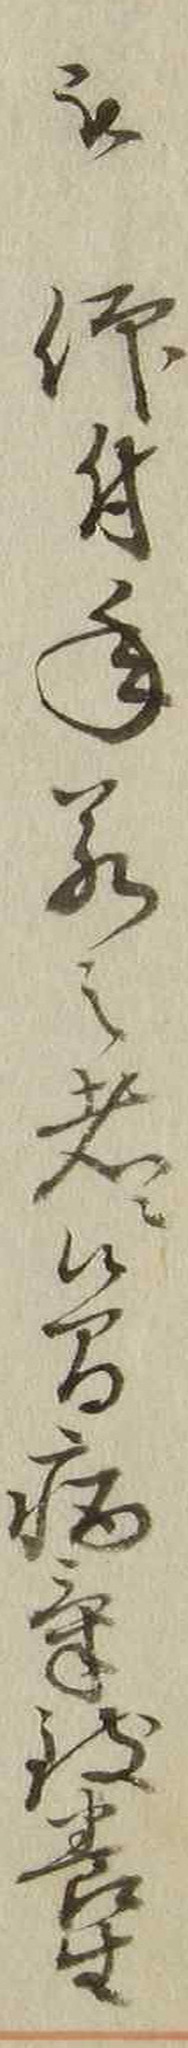被仰付年若之者ニ候間病気致養生
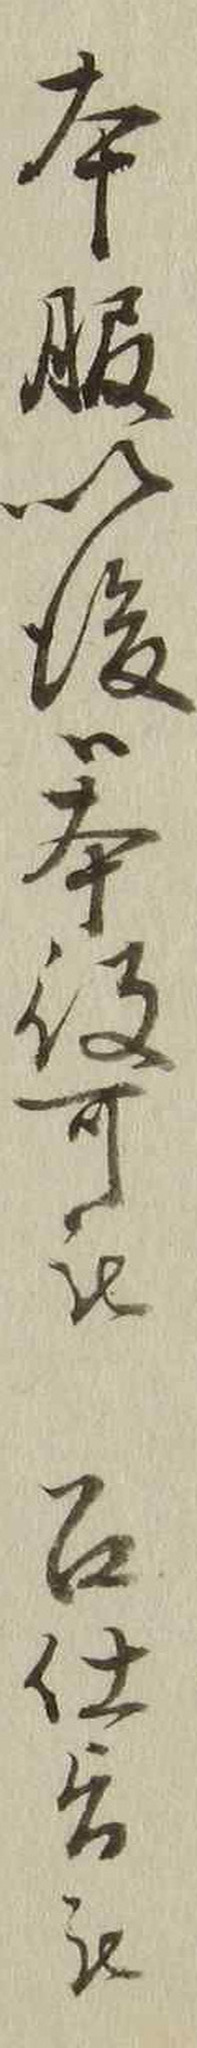本服以後ハ本役可被召仕旨被
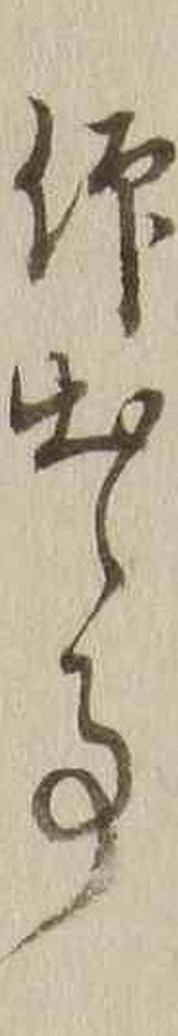仰出候事
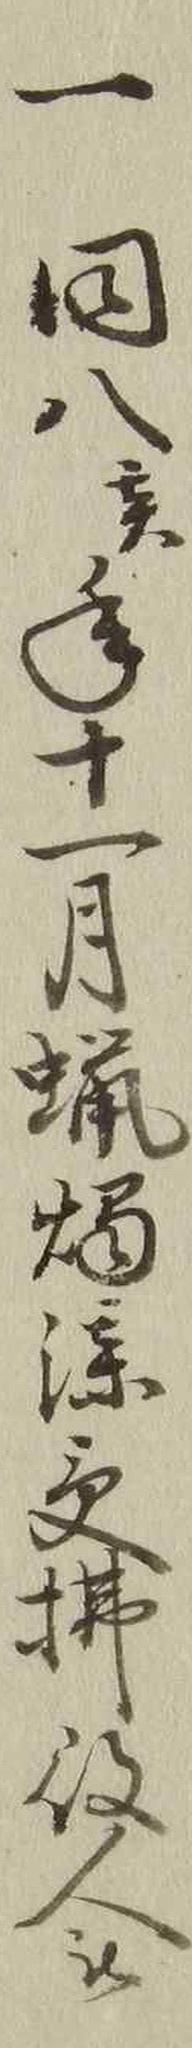一同八亥年十一月蝋燭漆受払役人被
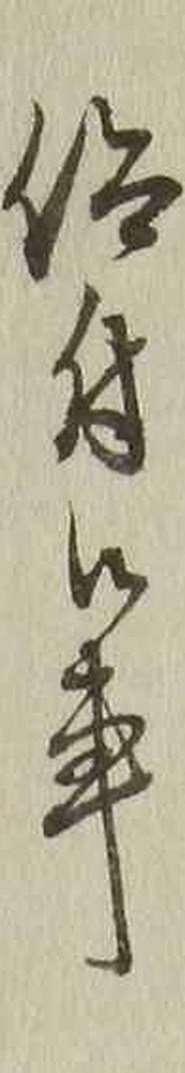仰付候事
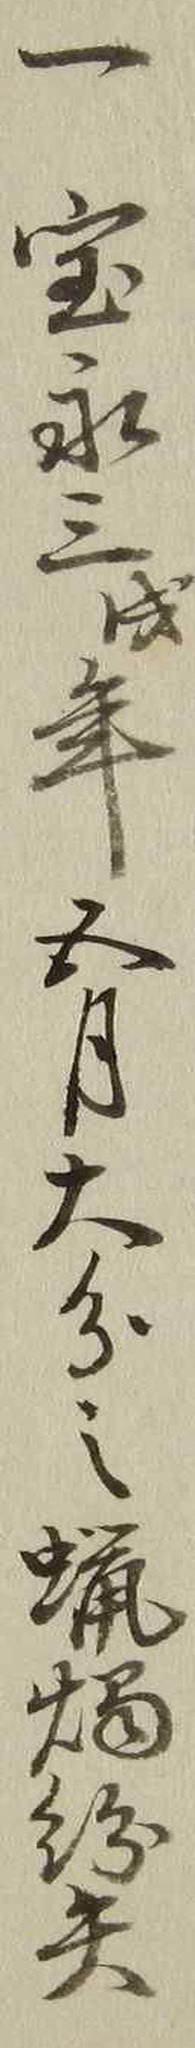一宝永三戌年五月大分之蝋燭紛矢
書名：諸士系譜　巻之27　い之部27
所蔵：会津若松市立会津図書館
